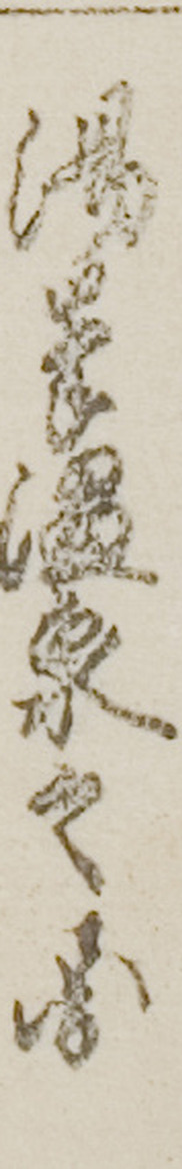湯峯温泉之圖
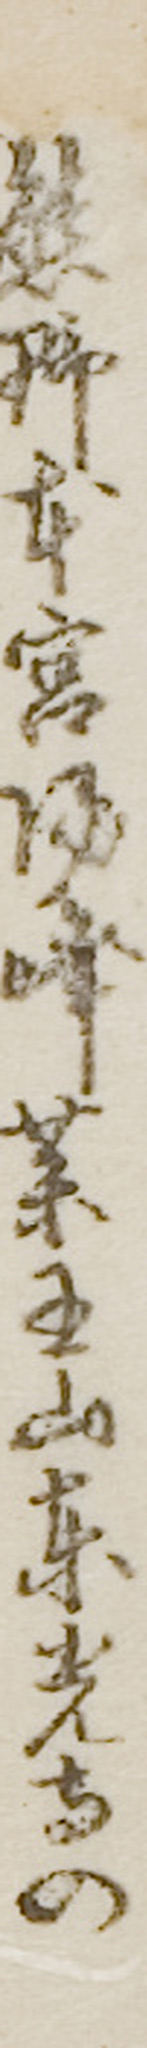熊野本宮湯峰薬王山東光寺の
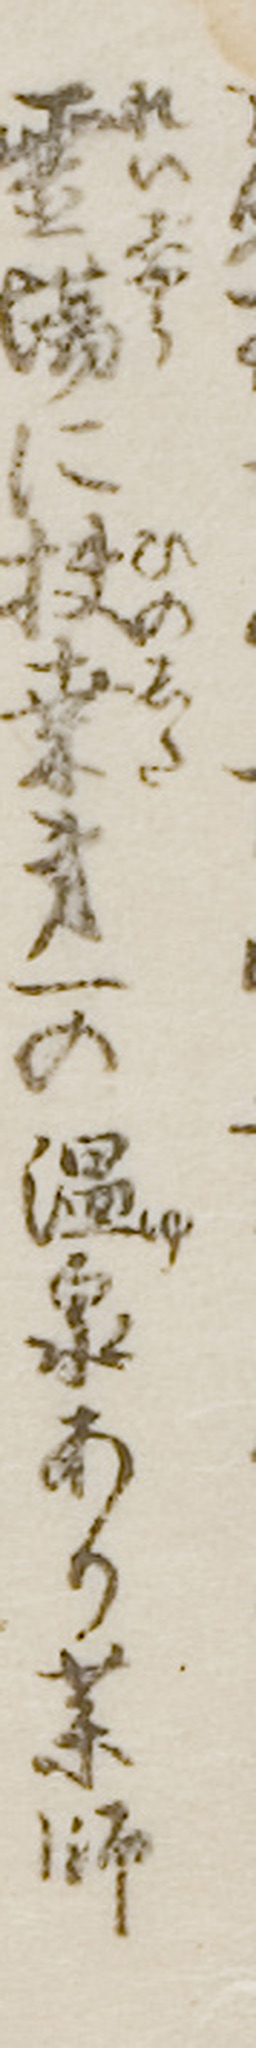霊場に扶桑第一の温泉あり薬師
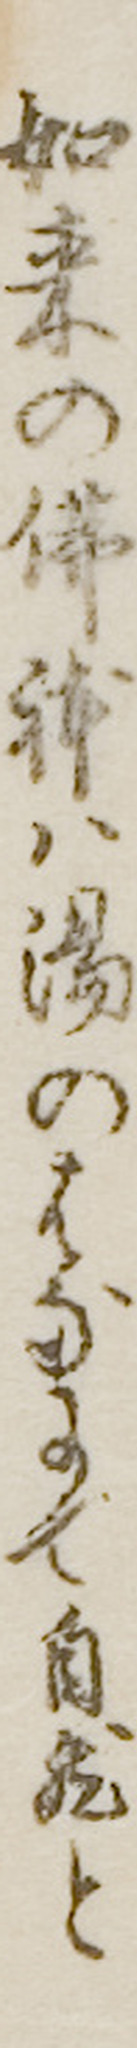如来の佛躰ハ湯のはなにて自然と
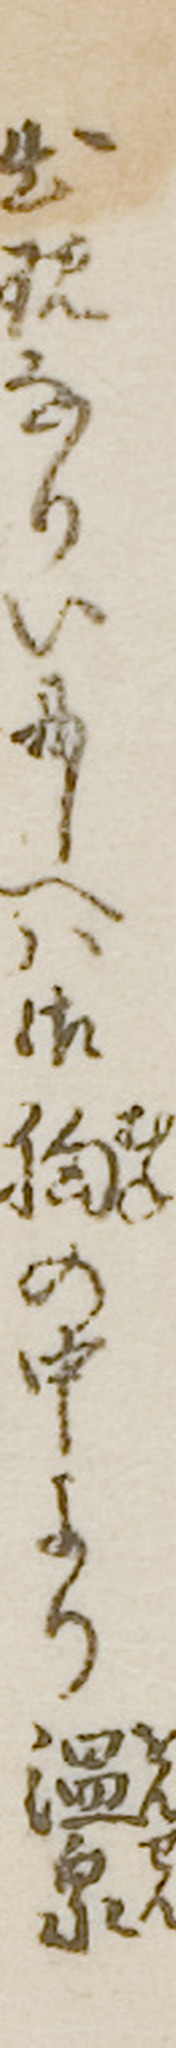出現なりいにしへハ御胸の中より温泉
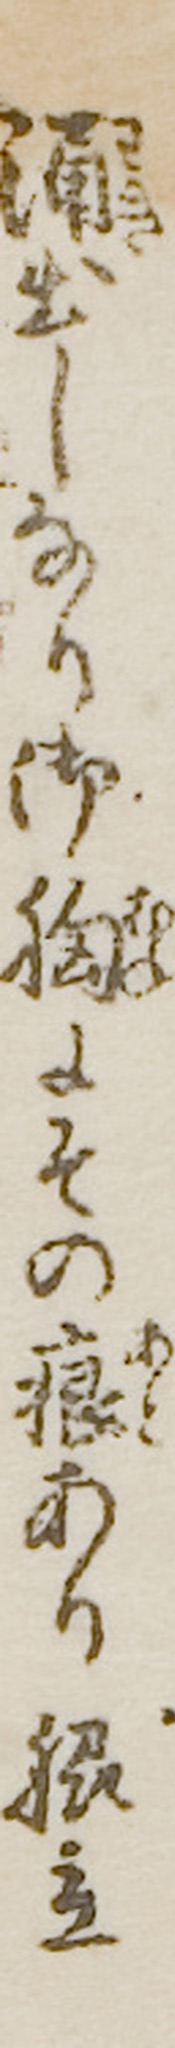涌出しなり御胸にその痕あり脇立
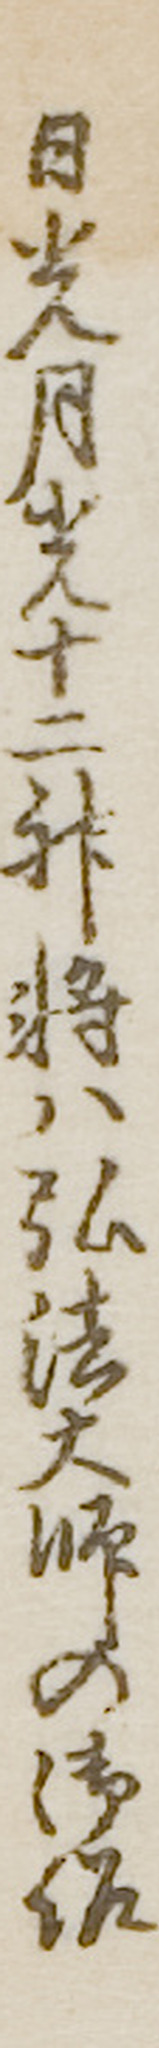日光月光十二神将ハ弘法大師の御作
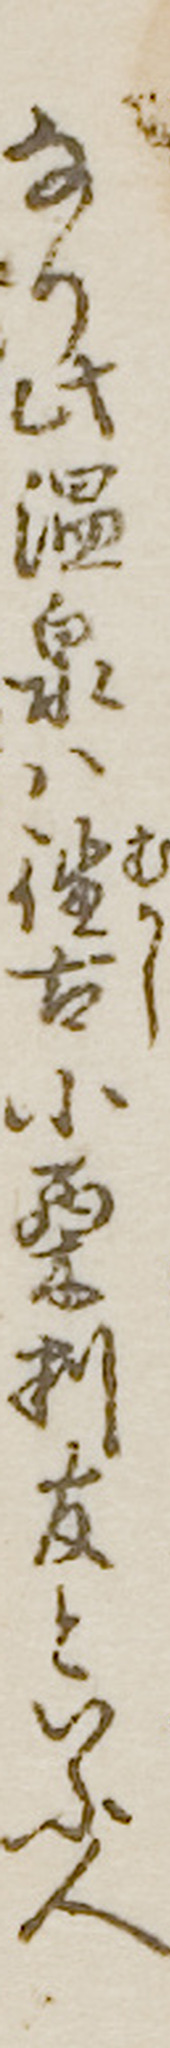なり此温泉ハ往古小栗判官といふ人
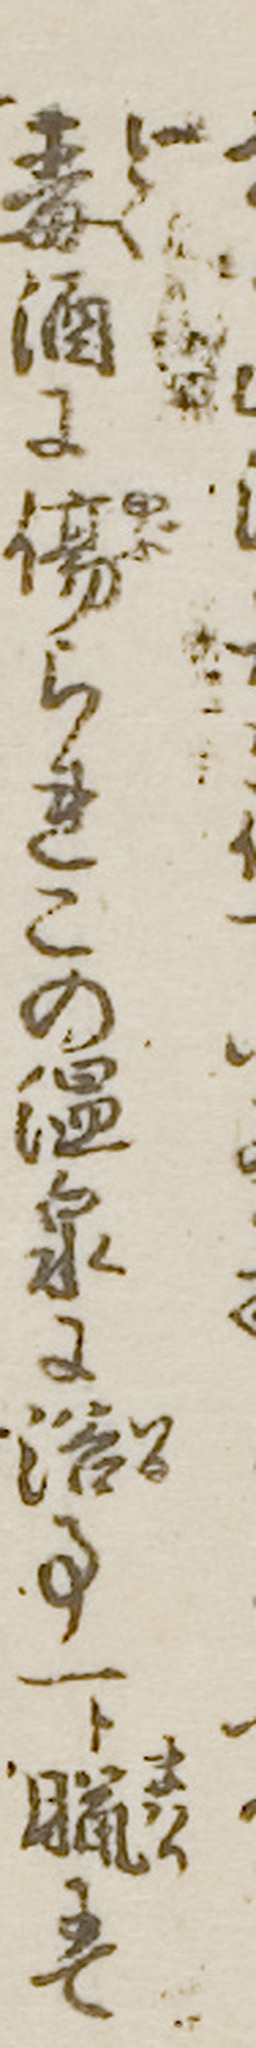毒酒に傷られこの温泉に浴事一ト臘にて
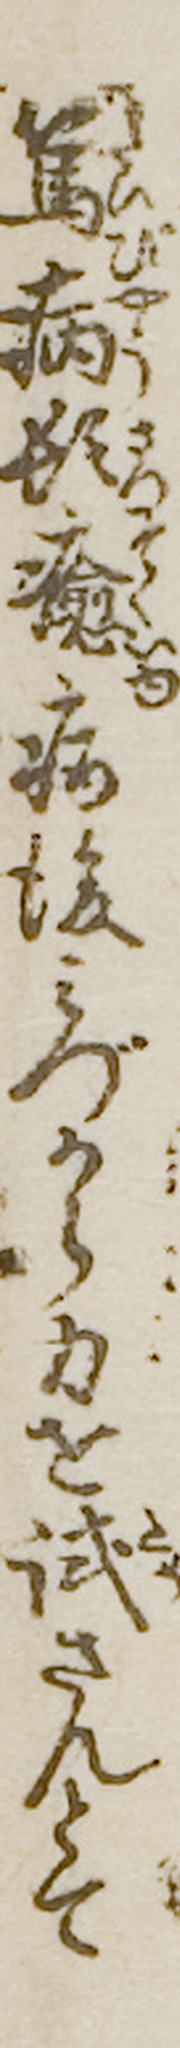篤病頓癒病後ミづから力を試さんとて
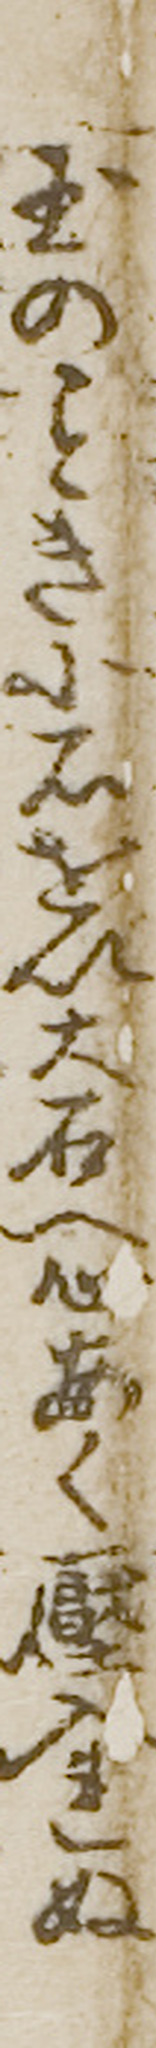玉のことき小石を大石へ心あく壓入れぬ
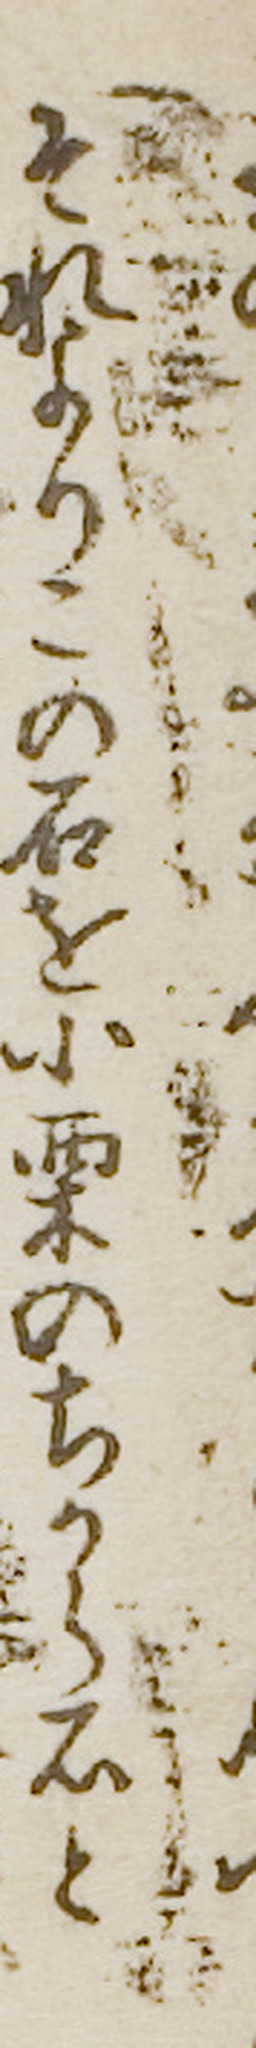それよりこの石を小栗のちから石と
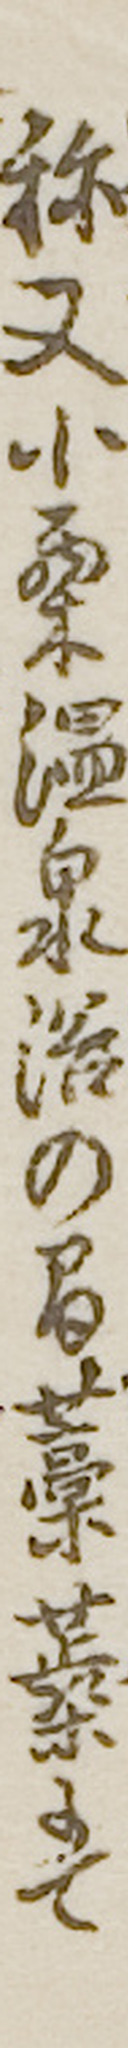称又小栗温泉浴の間藁蘂にて
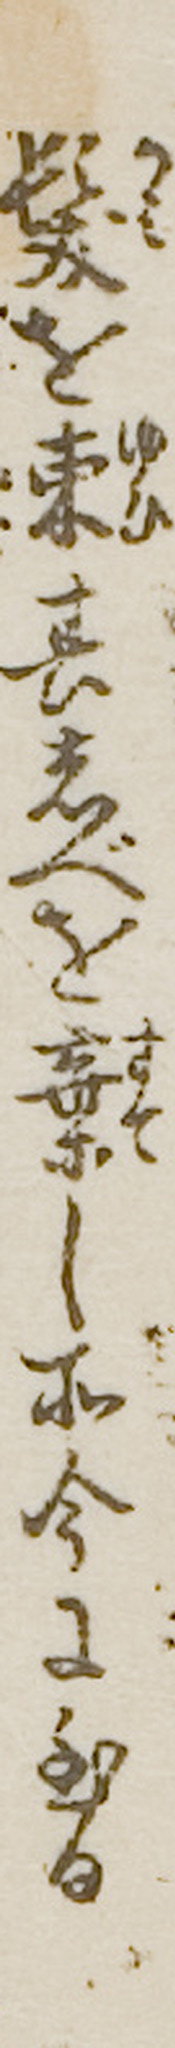髪を束其しべを棄し所今に至る
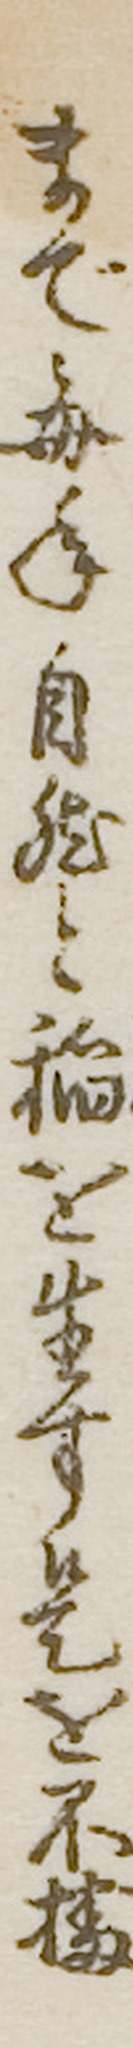まで毎年自然と稲を生す是を不播
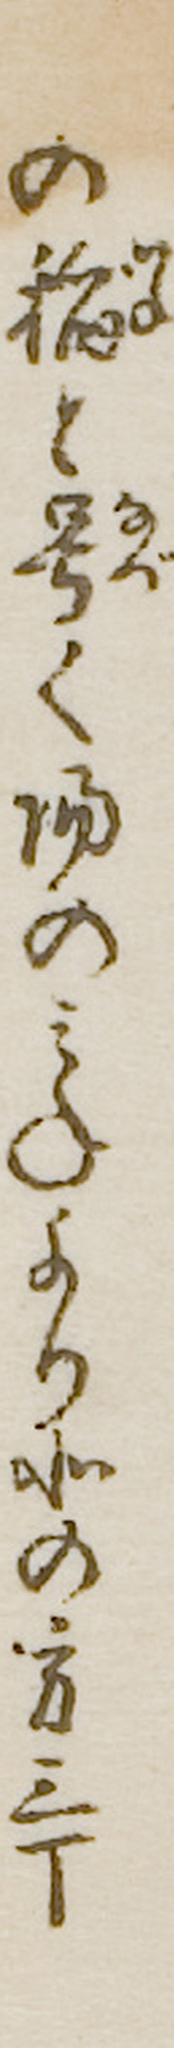の稲と号く湯のミねより北の方三丁
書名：[紀州熊野本宮湯峯温泉]
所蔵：東京大学総合図書館 General Library in the University of Tokyo, JAPAN
